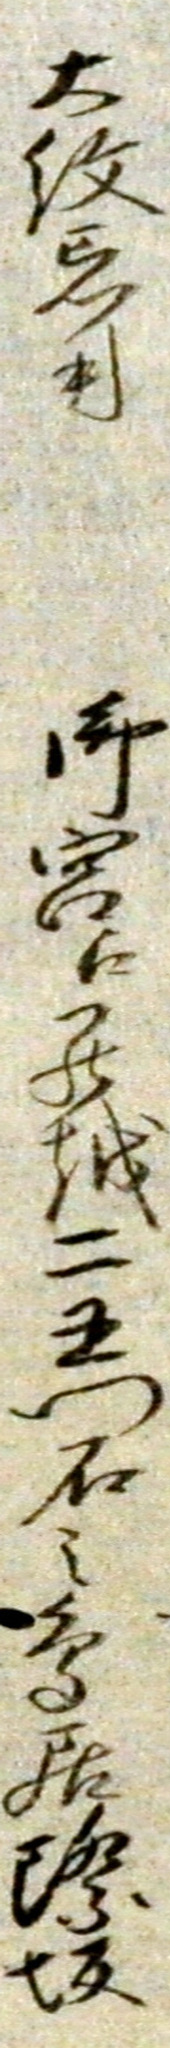大紋着用御宮江罷越二王門石之鳥居際坂
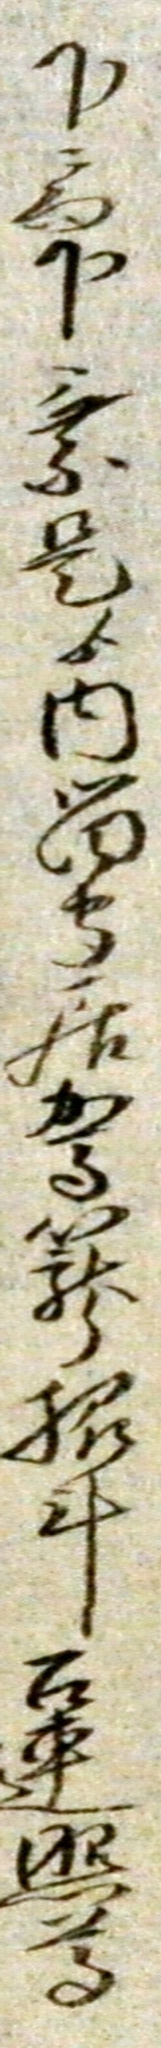下ニ而下乗是ゟ内留守居駕籠脇斗召連照尊
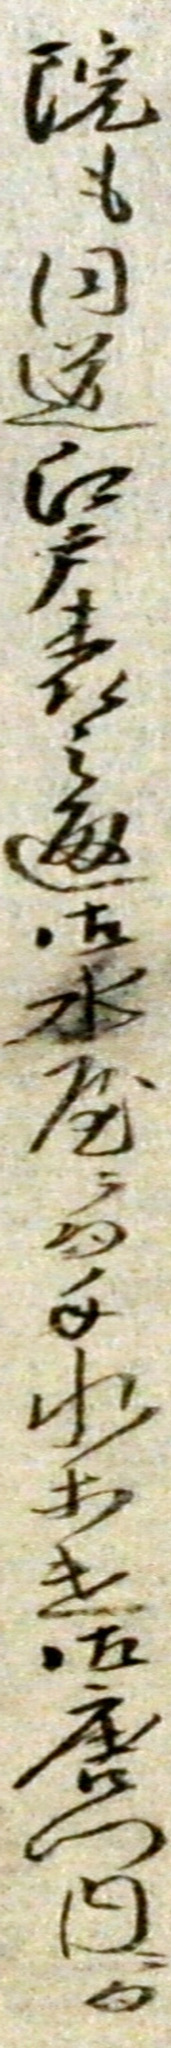院同道江戸表之通御水屋ニ而手水相遣御唐門内ニ而
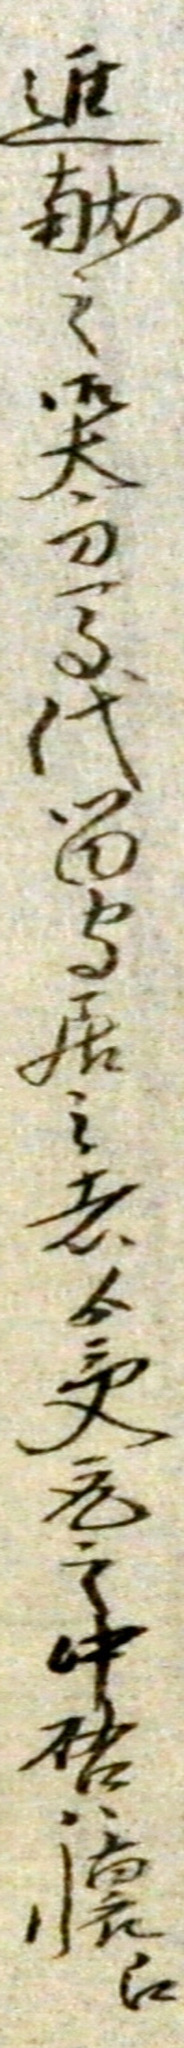進献之御太刀馬代留守居之者ゟ受取之中啓ㇵ懐江
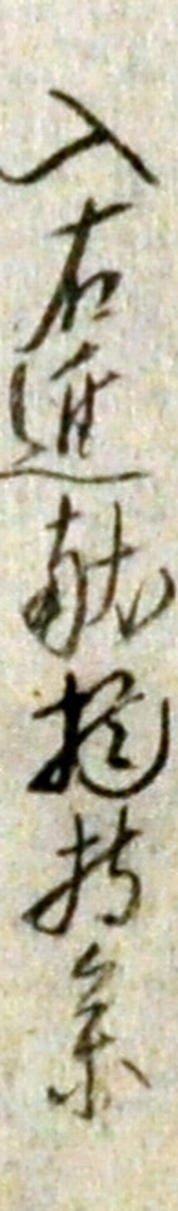入右進献物持参
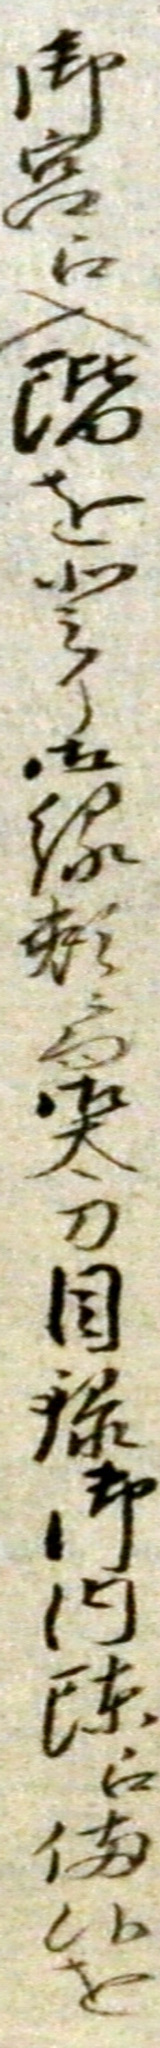御宮江入階を登り御縁頬ニ而御太刀目録御内陣江備え候を
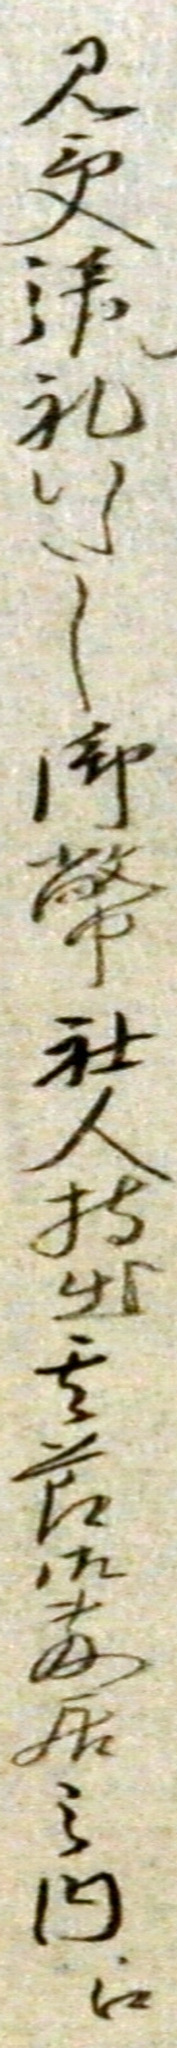見受拝礼いたし御幣社人持出其御敷居之内江
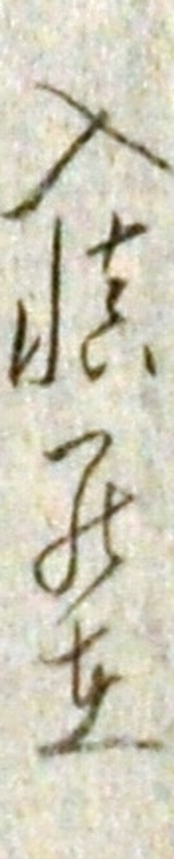入慎罷在
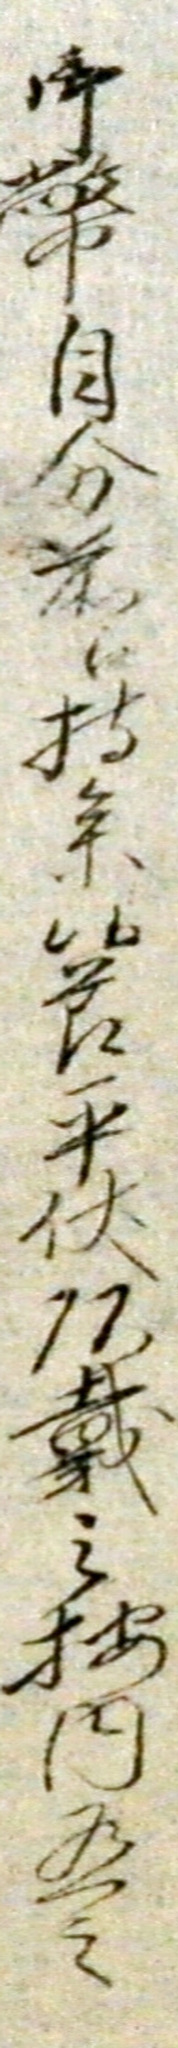御幣自分前江持参候節平伏頂戴之按内有之
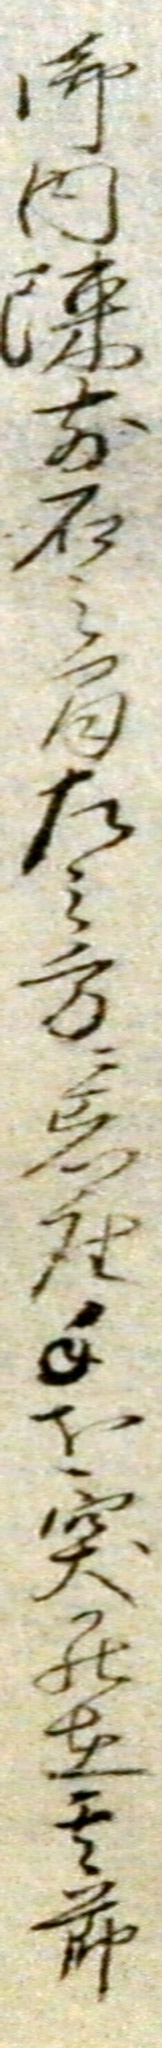御内陣前石之間左之方二着座手を突罷在其節
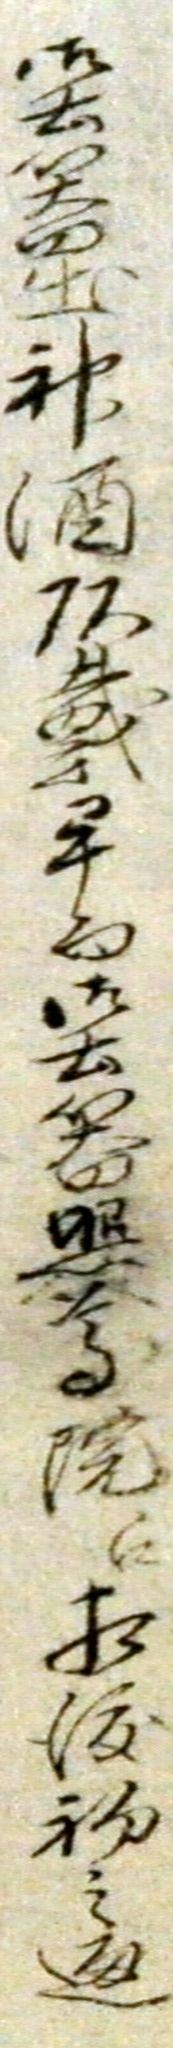御土器出神酒頂戴畢而御土器照尊院江相渡初之通
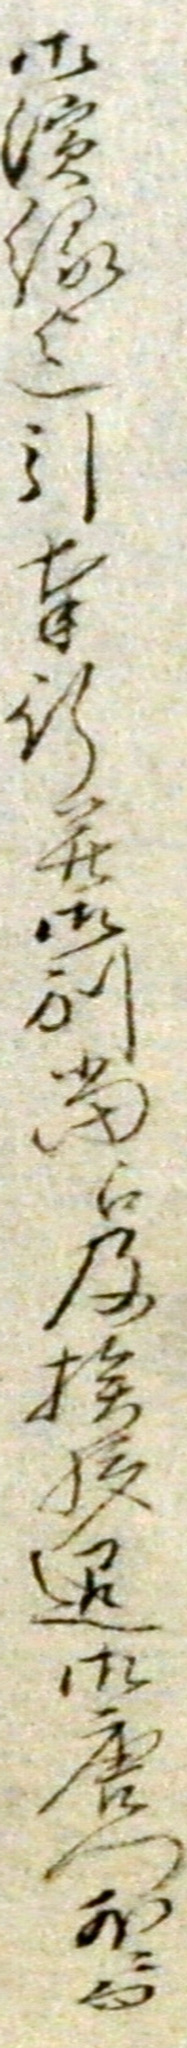御縁頬迄引奉行幷御別当江及挨拶退御唐門外ニ而

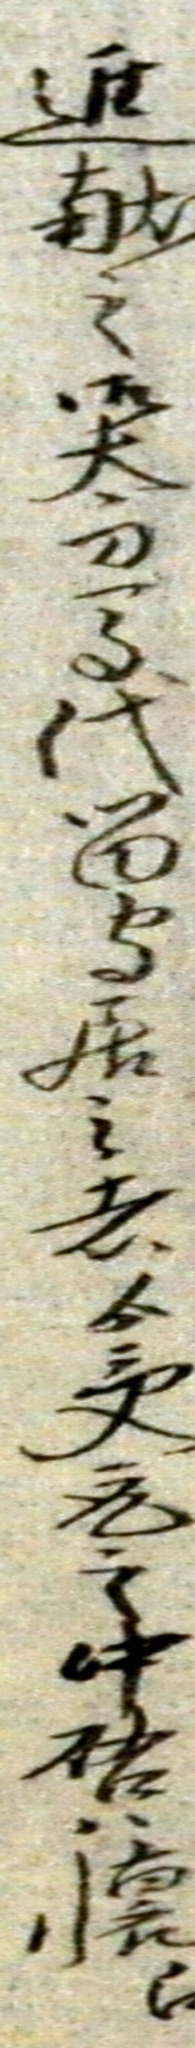進献之御太刀馬代留守居之者ゟ受取之中啓ハ懐江
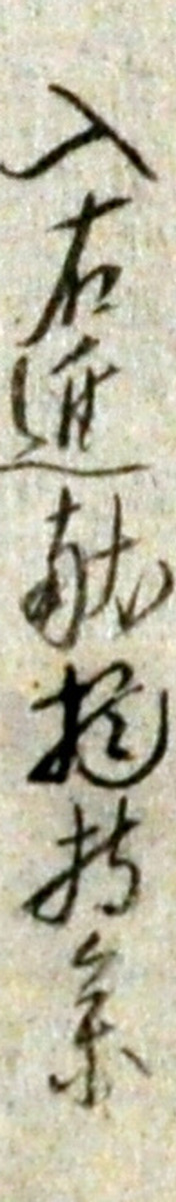入右進献物持参
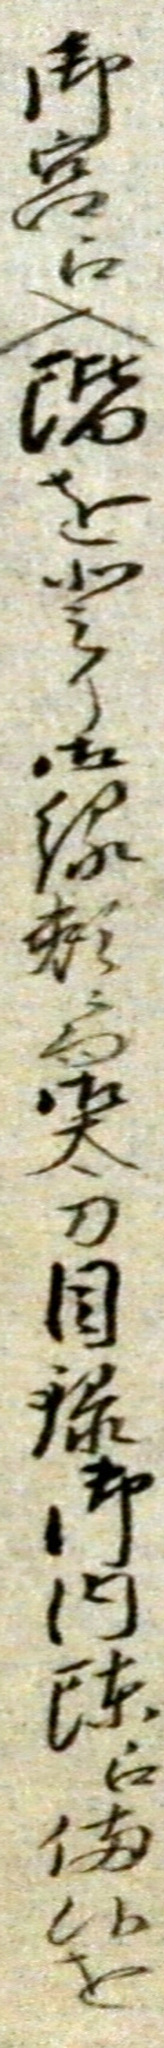御江入階階を登り御縁頬ニ而御太刀目録御内陣江備候を
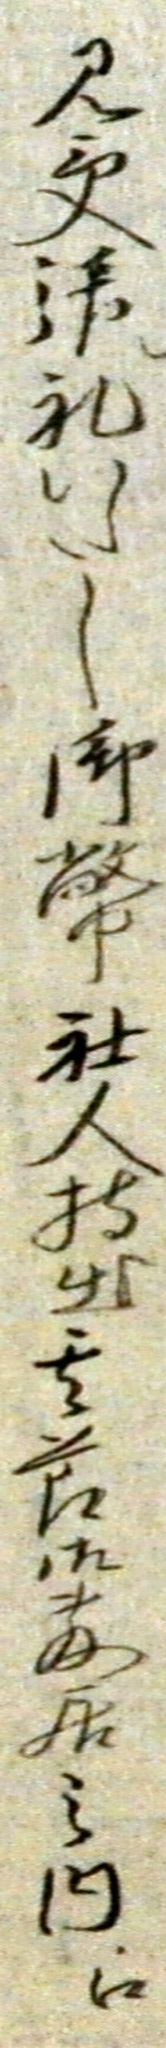見受拝礼いたし御幣社人持出其節御敷居之内江
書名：日光御名代相勤候節ノ留
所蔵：伊那市立高遠町図書館・合同会社AMANE
